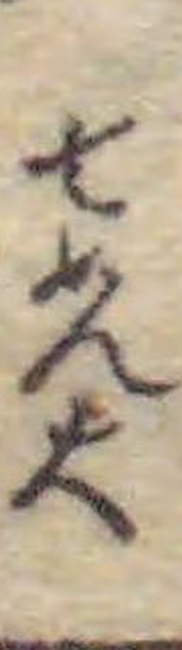七めん大
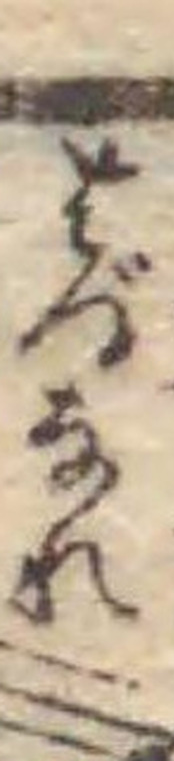はづなれ
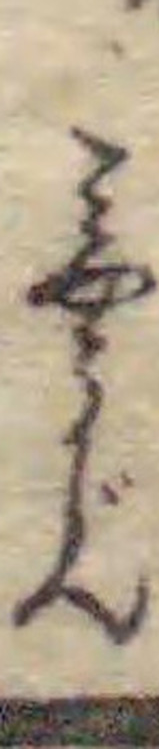みやうじん
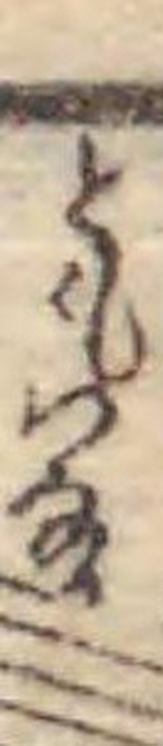ともいなか
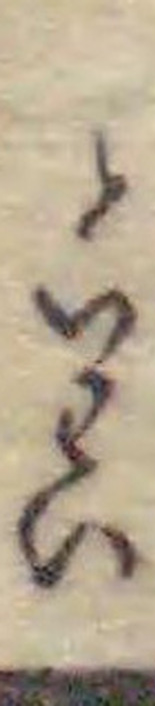ちいわい
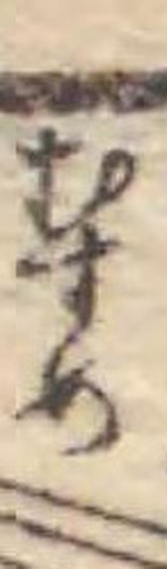むすめ
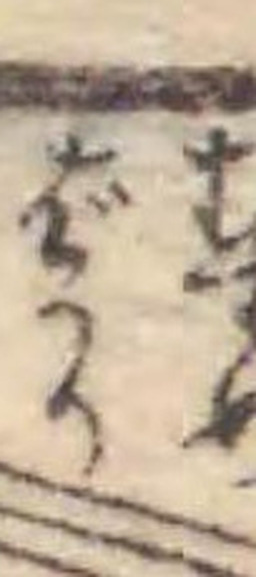ばかり
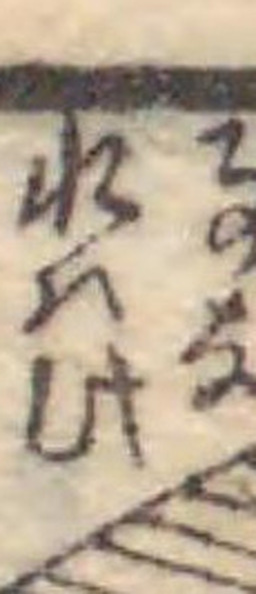れは此
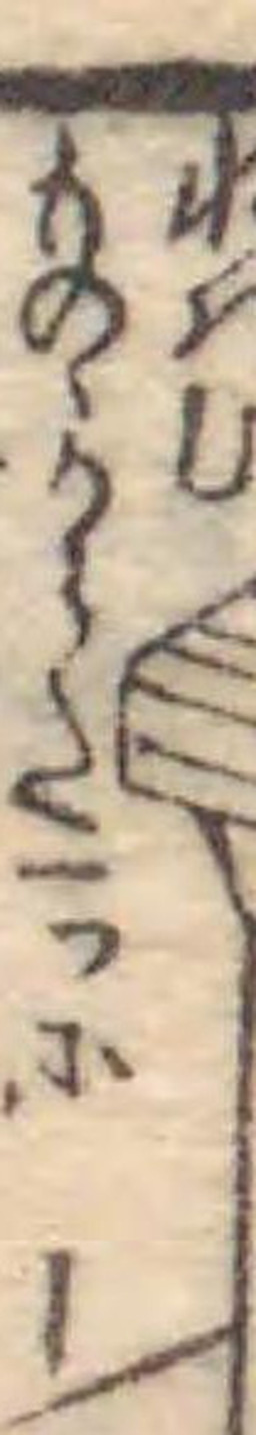ものゝからた一つに
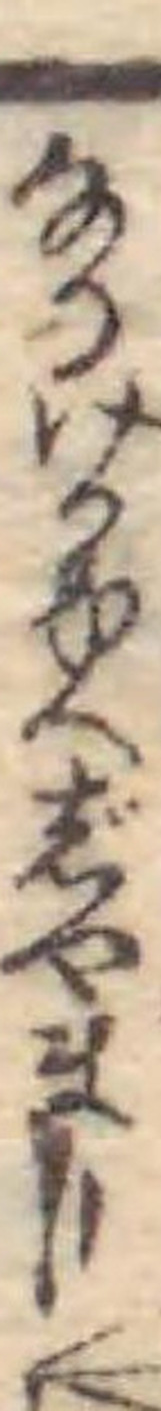なりけるゆへじやま
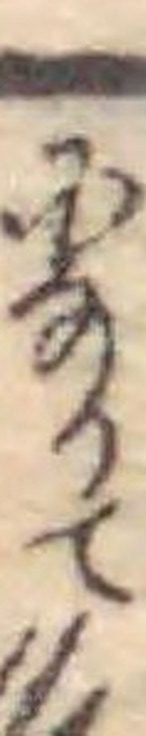になりて
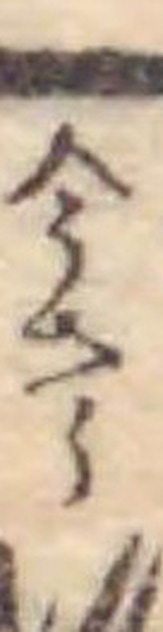今さら
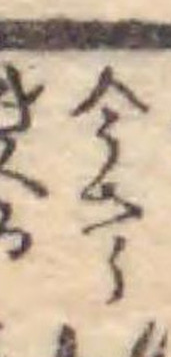今さら
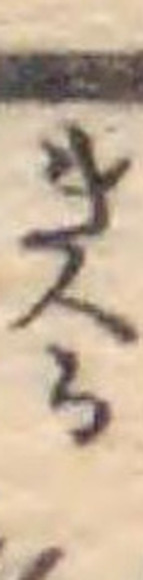きへる

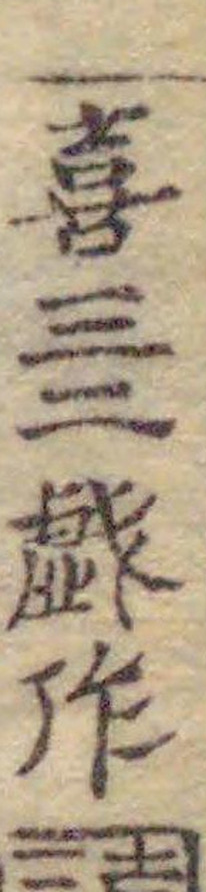喜三二戯作
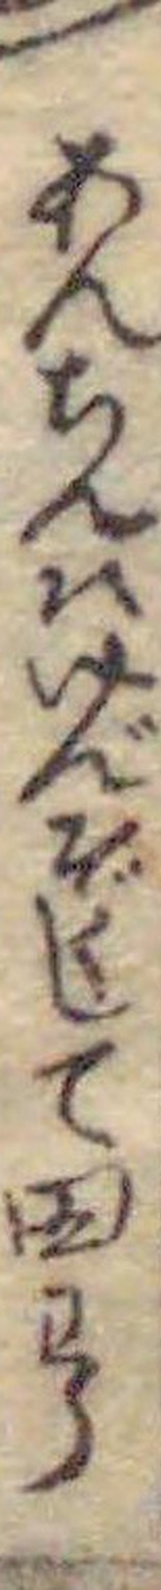あんちんはげんぞくして田わら
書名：鐘入七人化粧 : 3巻
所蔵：国立国会図書館 National Diet Library, JAPAN
